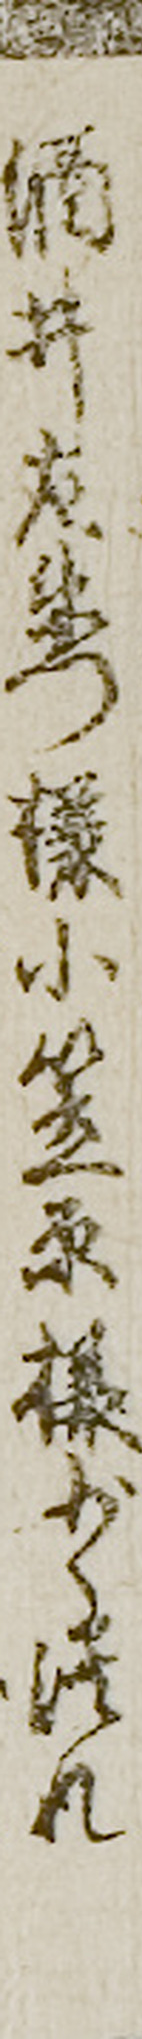酒井左衛門様小笠原様少々潰れ
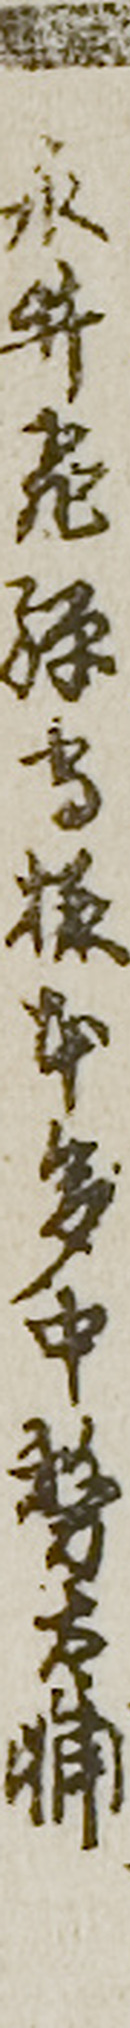永井飛騨守様本多中務太輔
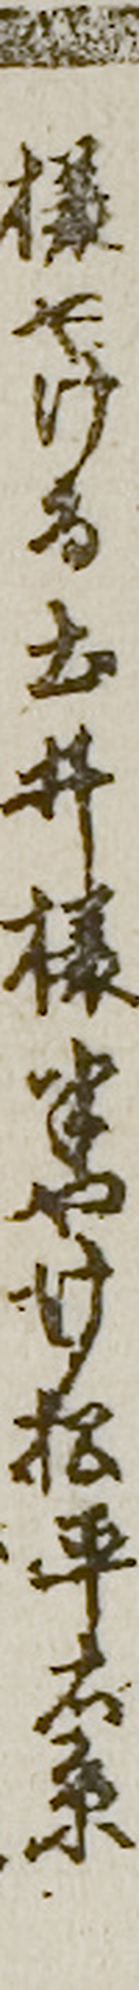様やける土井様半やけ松平右京
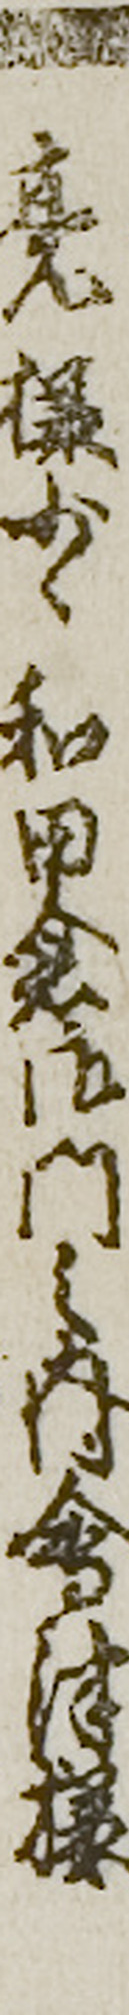亮様少々和田倉御門之内会津様
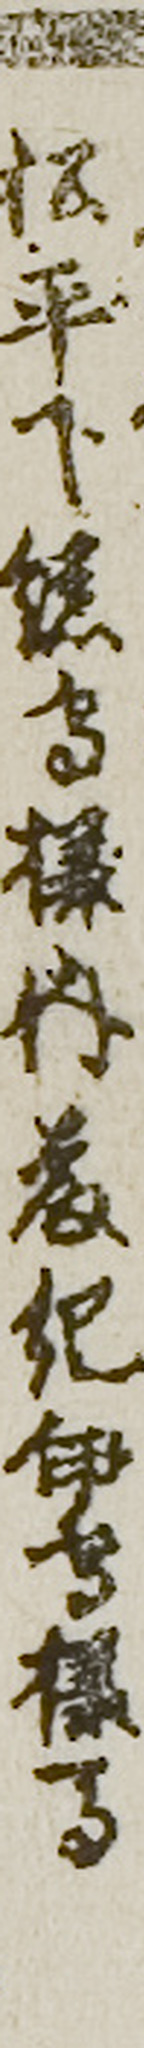松平下総守様内藤紀伊守様馬
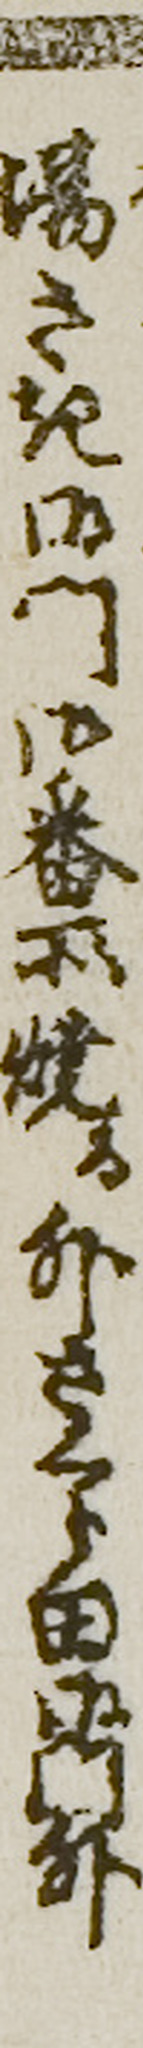場さき御門御番所焼る外さくら田御門外
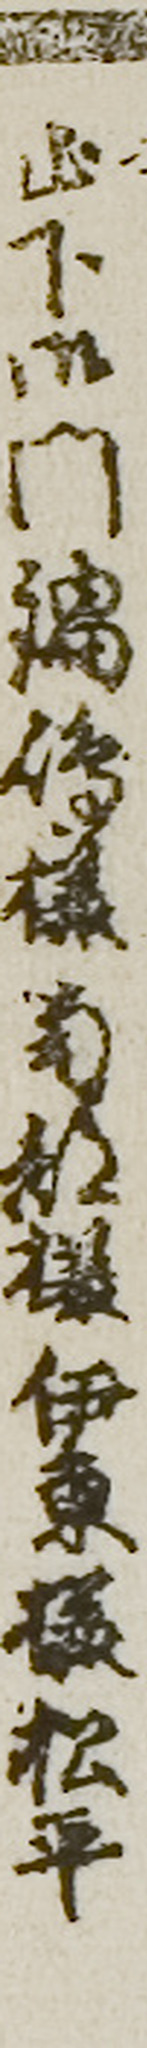山下御門鍋嶋様南部様伊東様松平
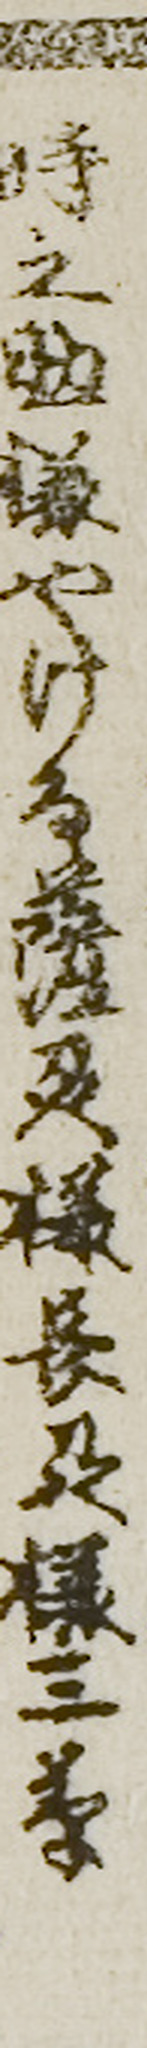時之助様やける薩州様長州様三草
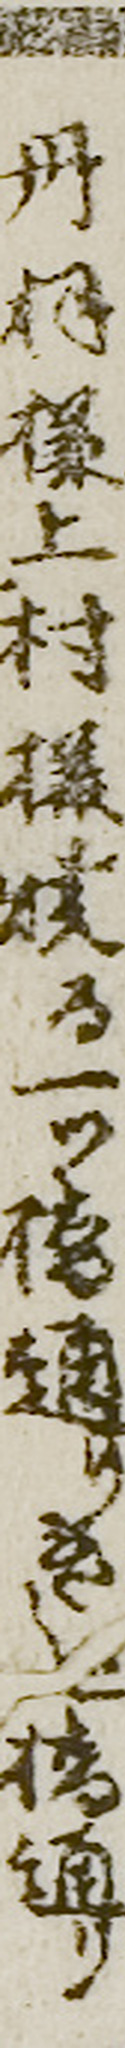丹羽様上村様焼る一ツ橋通りきじ橋通り
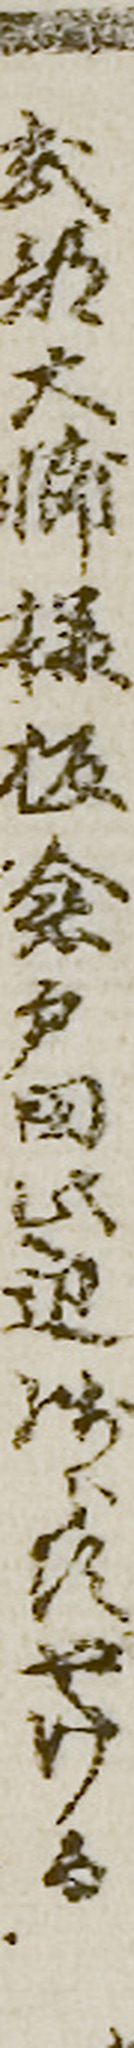式部大輔様板倉戸田此辺残らずやける
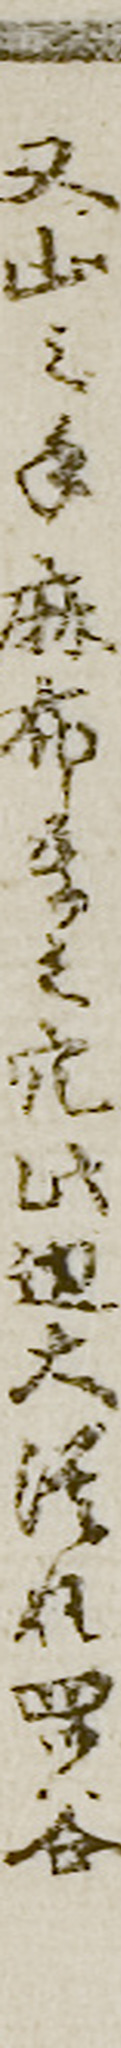又山之手麻布まみ穴此辺大潰れ四ツ谷
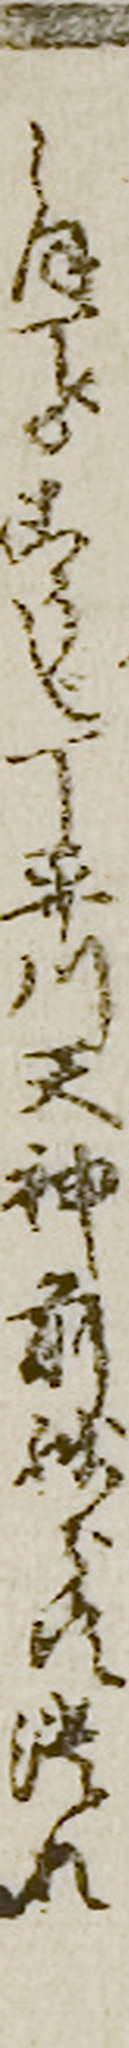しほ丁よりこうじ丁平川天神前残らず潰れ
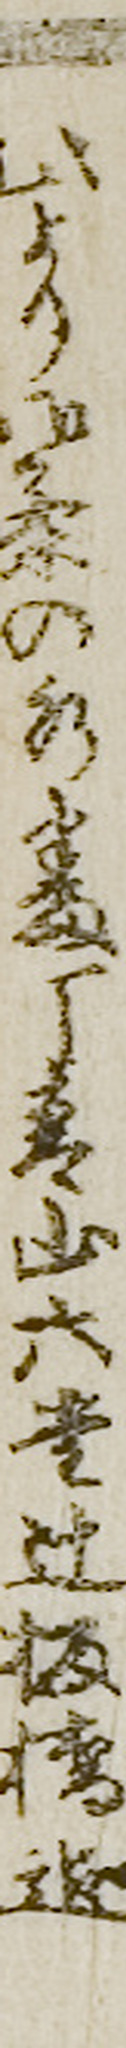此より御茶の水番丁青山六堂辻板橋迄
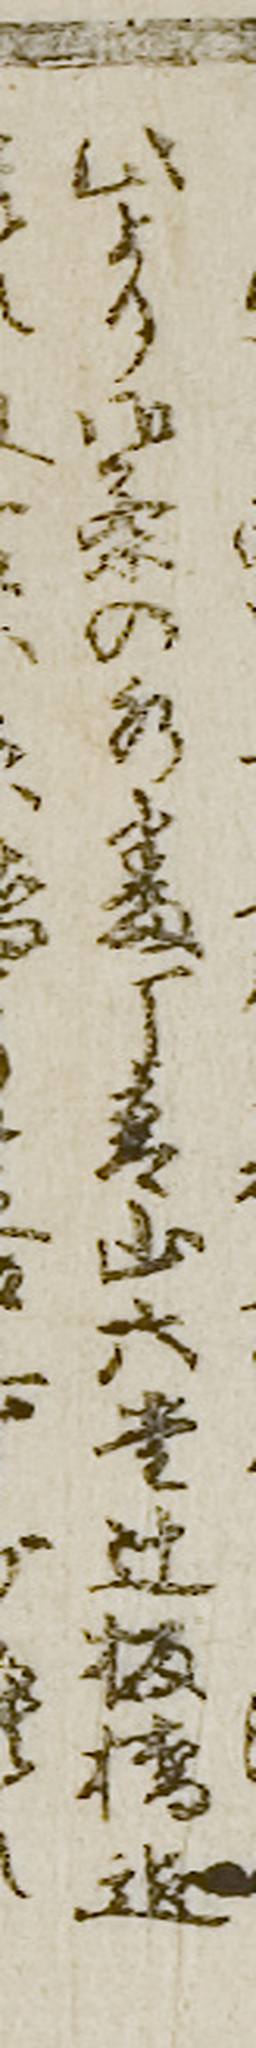潰れ又一口は京橋より芝口三丁少々潰れ
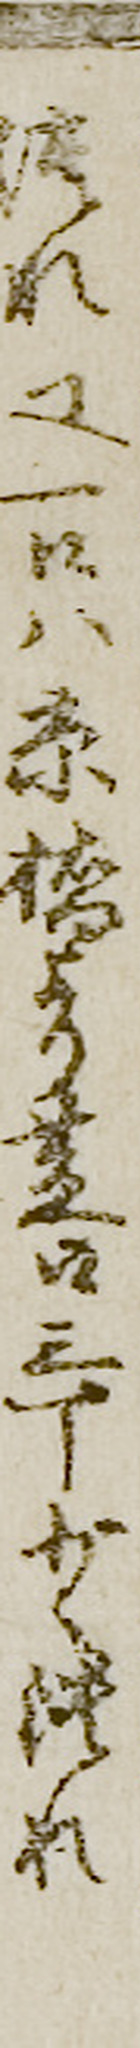潰れ又一口は京橋より芝口三丁少々潰れ
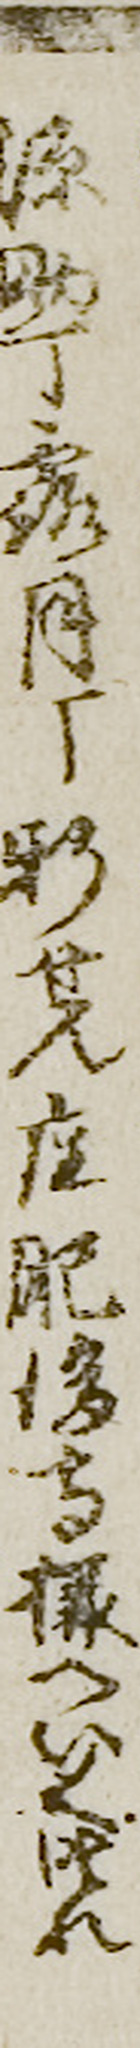源助丁露月丁新せん座肥後守様へいくづれ
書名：江戸大地震出火場所附
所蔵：東京大学総合図書館 General Library in the University of Tokyo, JAPAN
